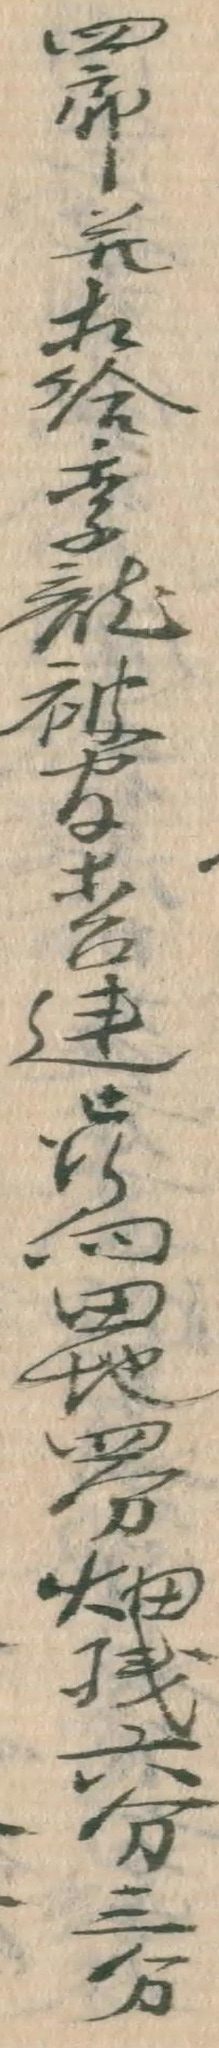四郎并相給季龍被官等召連候行向田地四分畑残六分三分
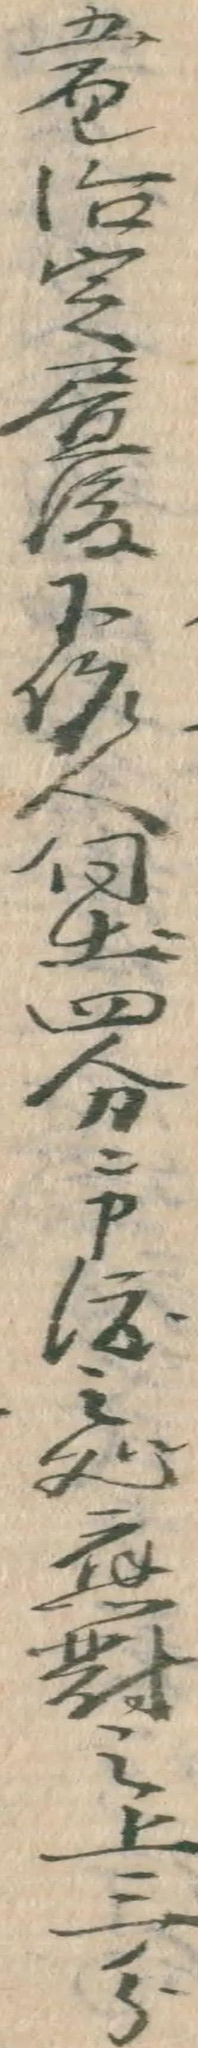五厘治定昼後下作人伺出四分ニ申渡之処應對之上三分
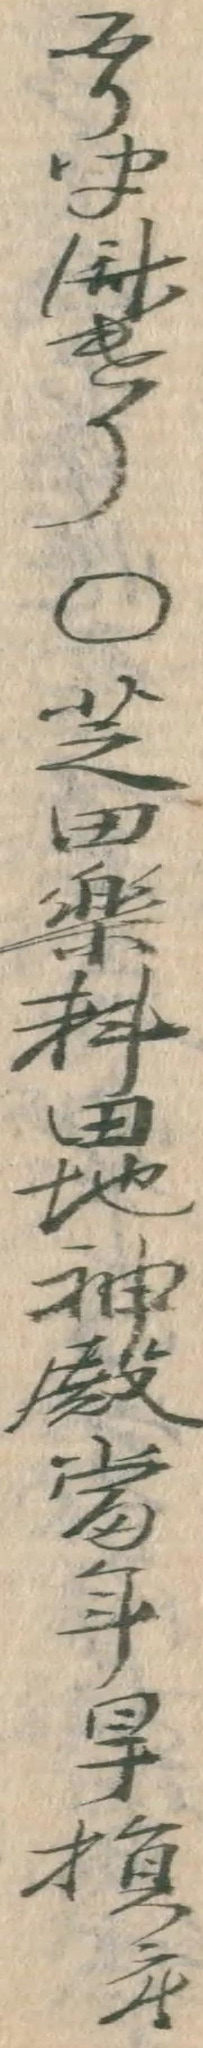五り半済遣り〇芝田楽科田地神殿當年旱損ニ付
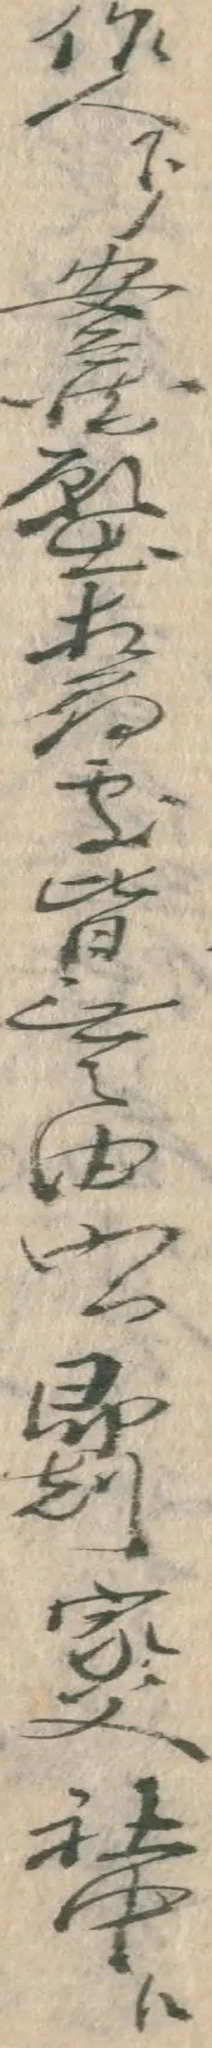作人下り安蔵願出相尋處皆無之由昨日即刻家父社中江
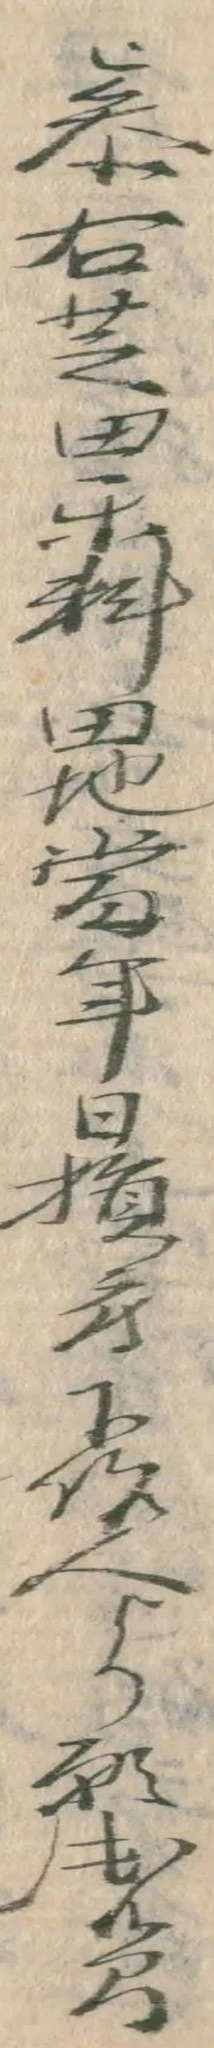被参右芝田楽料田地當年日日損ニ付下役人より願出候間
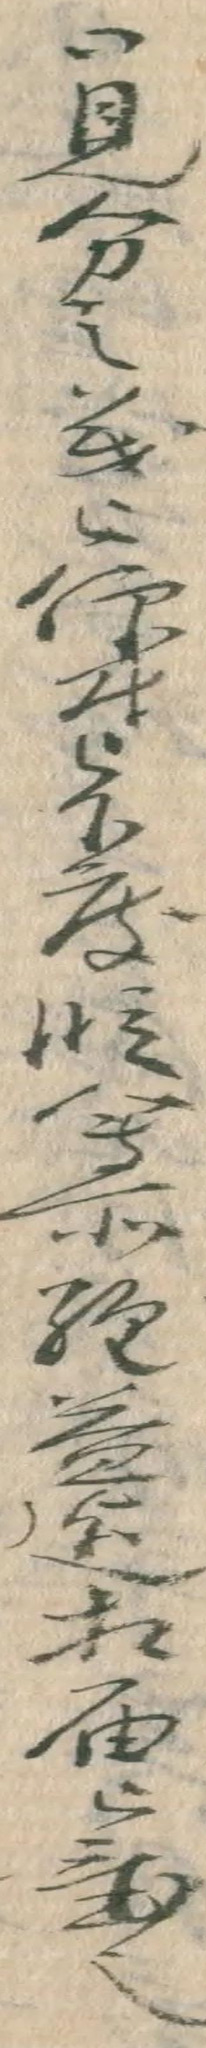御見分之義被仰付被下度段會所経益迄相届被置候
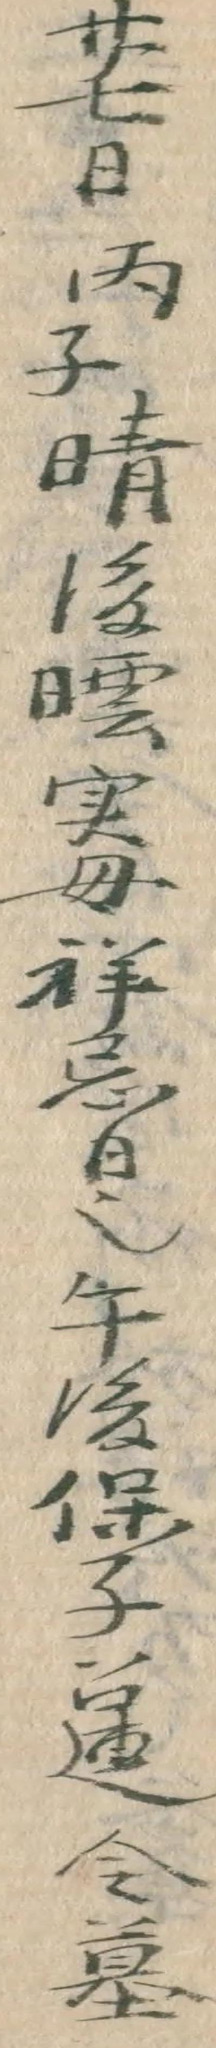廿七日丙子晴後曇実母祥忌日也午後保子召連令墓
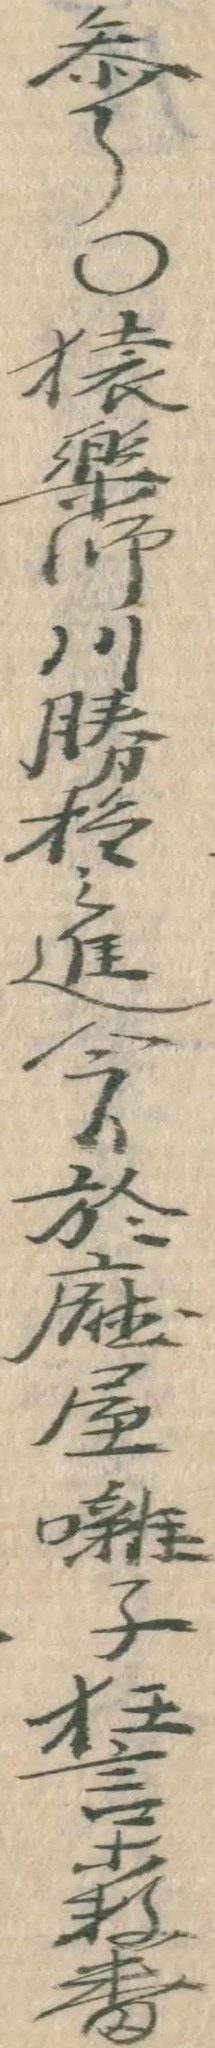参了○猿楽師川勝権之進今日於廳屋囃子狂言等数番
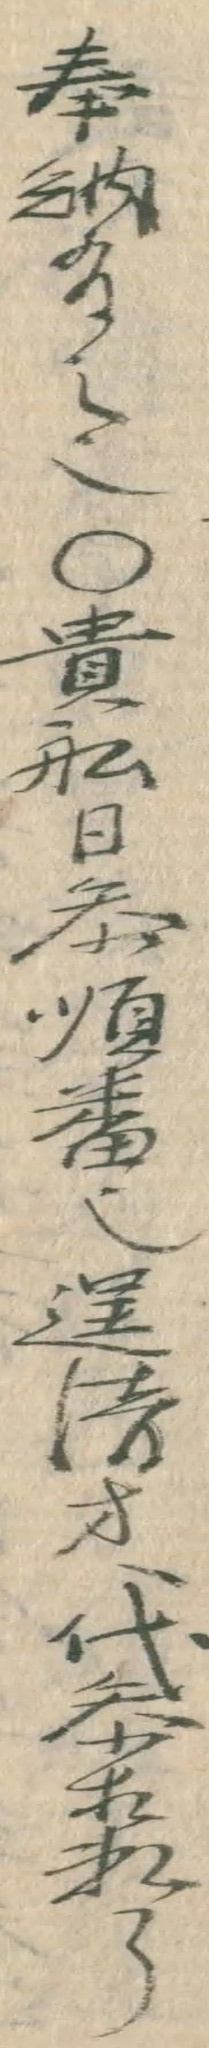奉納有之也〇貴舩日参順番也逞清方へ代参相頼了
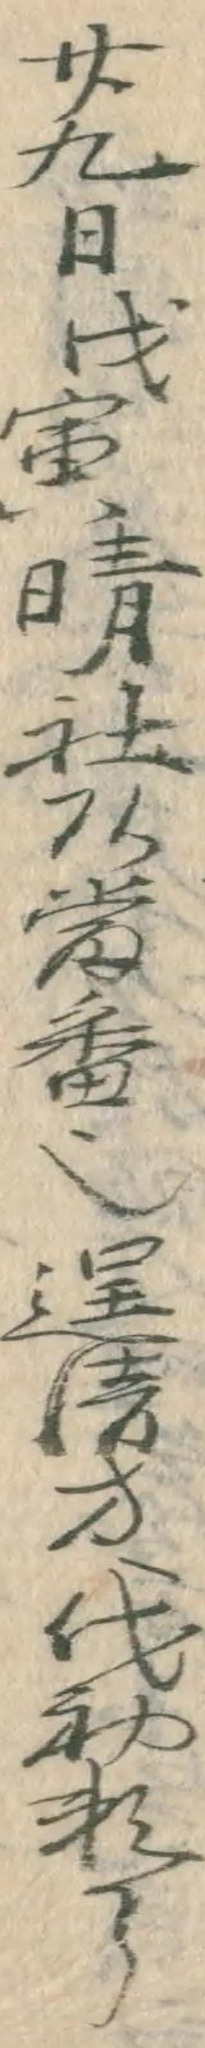廿九日戊寅晴社頭當番也逞清方へ代勤頼了
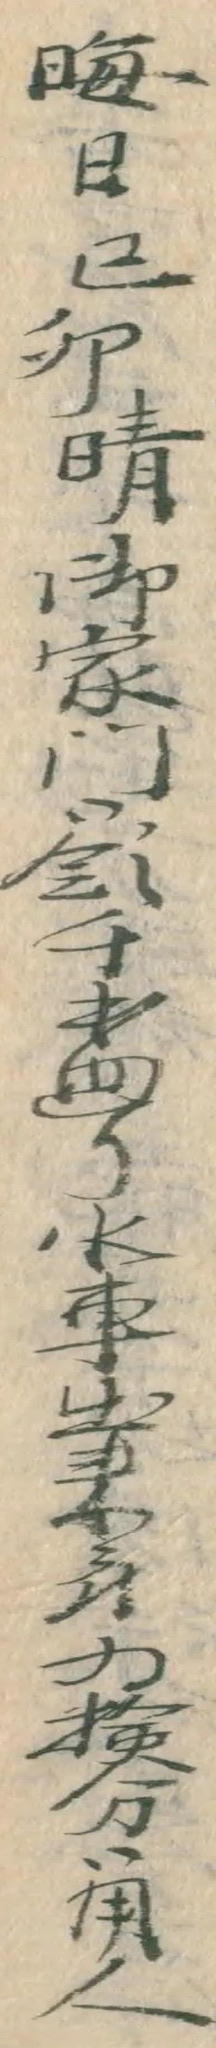晦日巳卯晴御家門御領千本廻り水車出来ニ為検分御用人

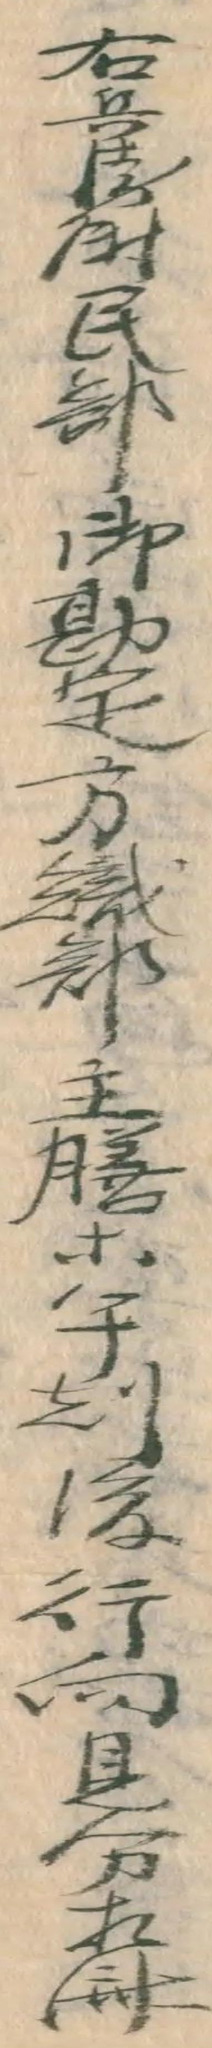右兵衛尉民部御勘定方織部主膳等午刻後行向見分相済
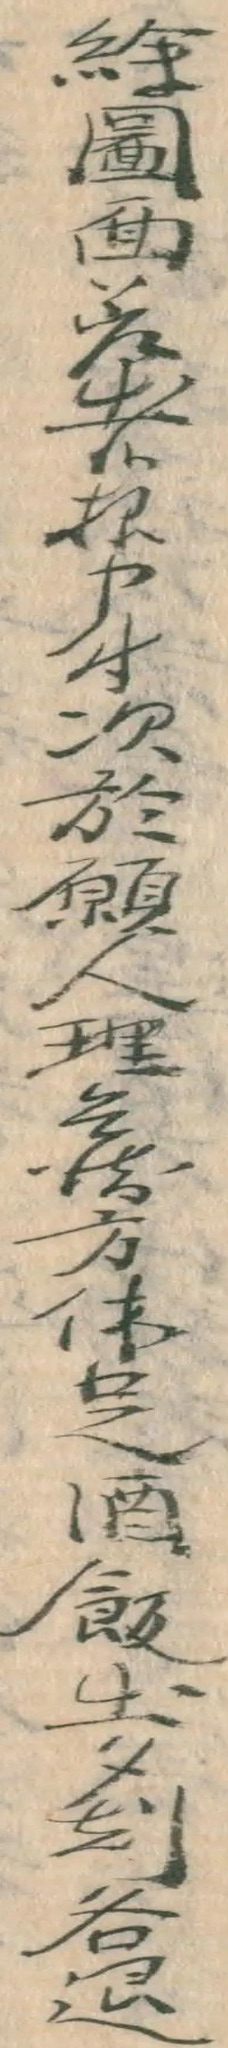紛圖面差出候様申付次於願人理兵衛方休足酒飯出夕刻各退
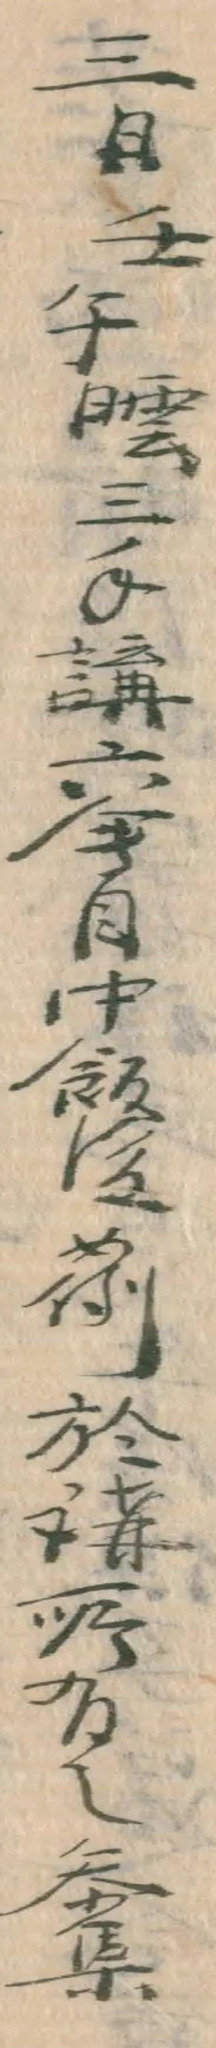三日壬午曇三手講六會目中飯後如例於講所有之参集
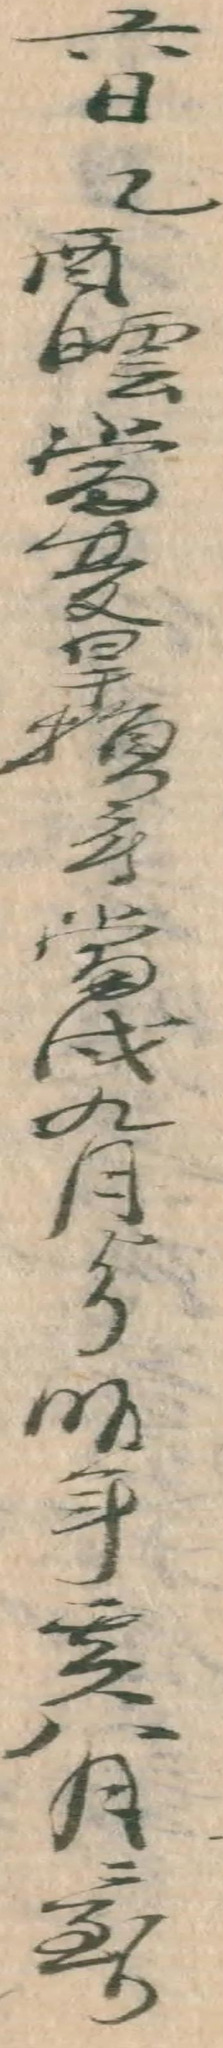六日乙酉曇當夏旱損ニ付當戌九月より明年亥八月ニ至リ
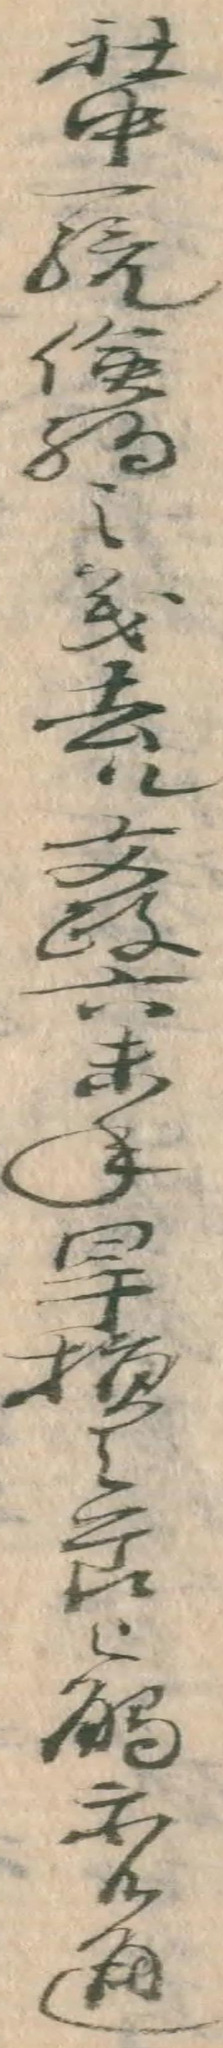社中一統倹約之義去ル文政六未年旱損之節被触示候通
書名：賀茂社記録. 第65冊
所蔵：国立国会図書館 National Diet Library, JAPAN
